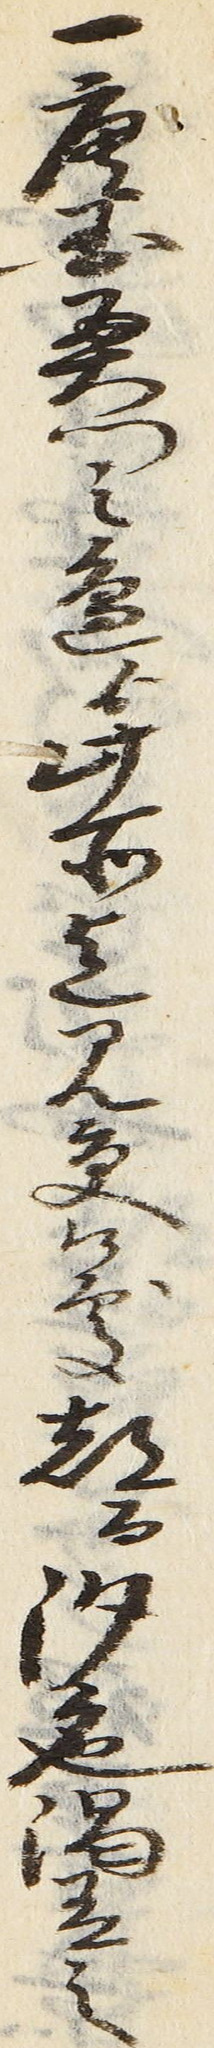一唐国奥門之邊ゟ此所迄見受候處都而汐辺渇有之
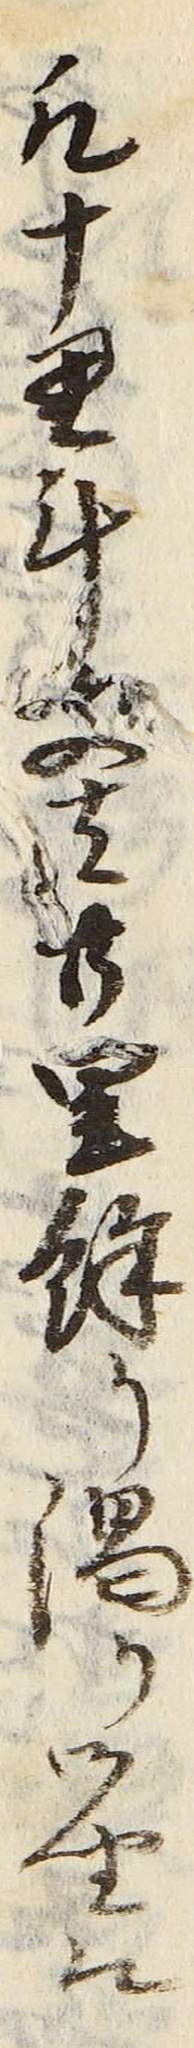凡十里斗前者廿里餘り渇り御座候
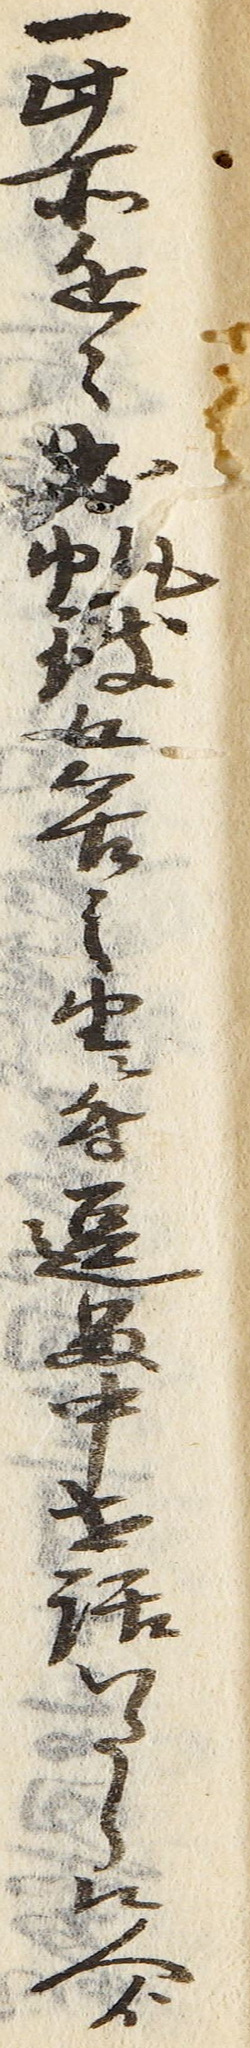一此所近々出帆致候筈之由ニ付逗留中世話いたし候人ゟ
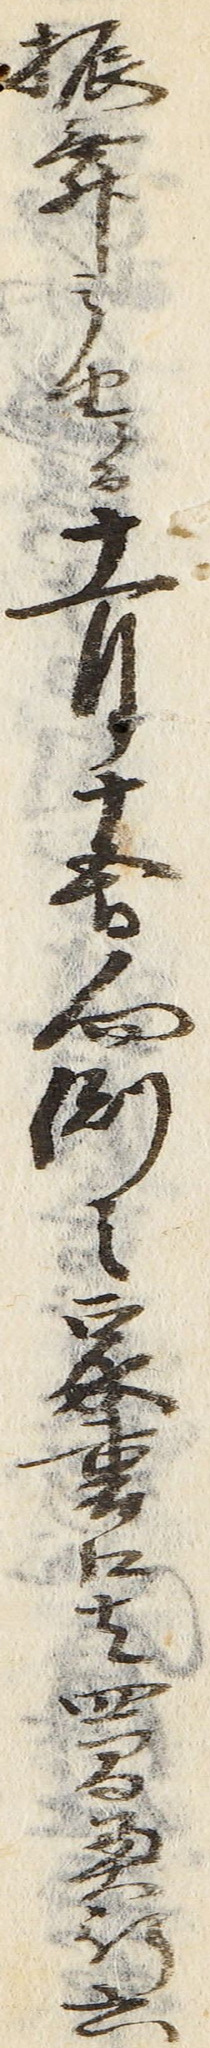振舞之由ニ而十一月十五日向側之家裏口者四間奥行六
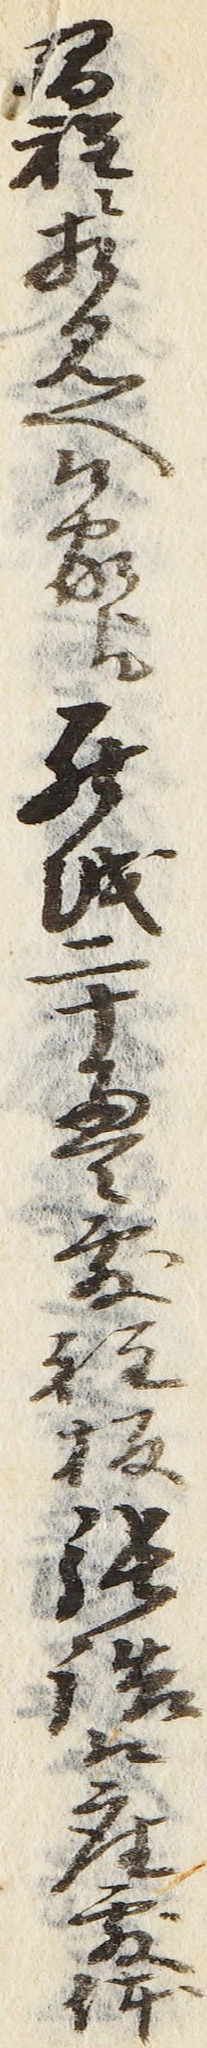間程ニ相見へ候家江罷越二十畳敷程板張詰候座敷体
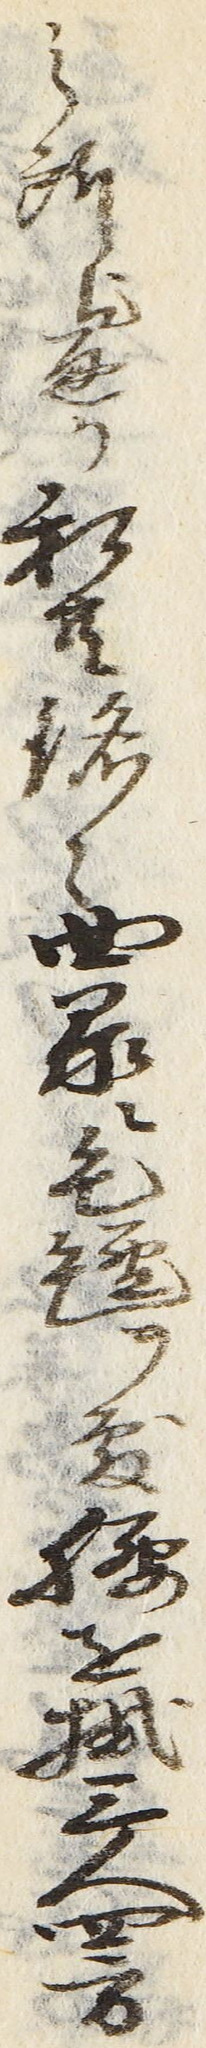之所江通り私共銘々曲禄二毛氊ヲ敷腰を掛三人四方
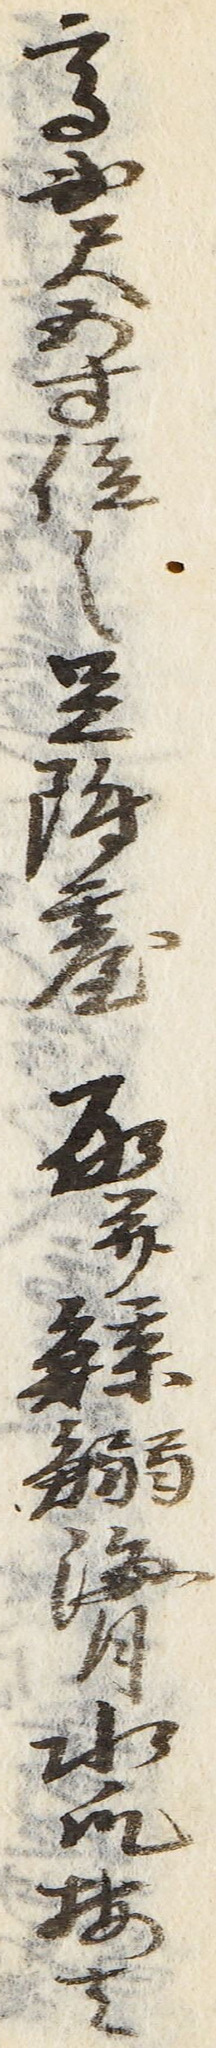高二尺五寸程之足附臺豕幷鯵鰯海月水瓜梅者
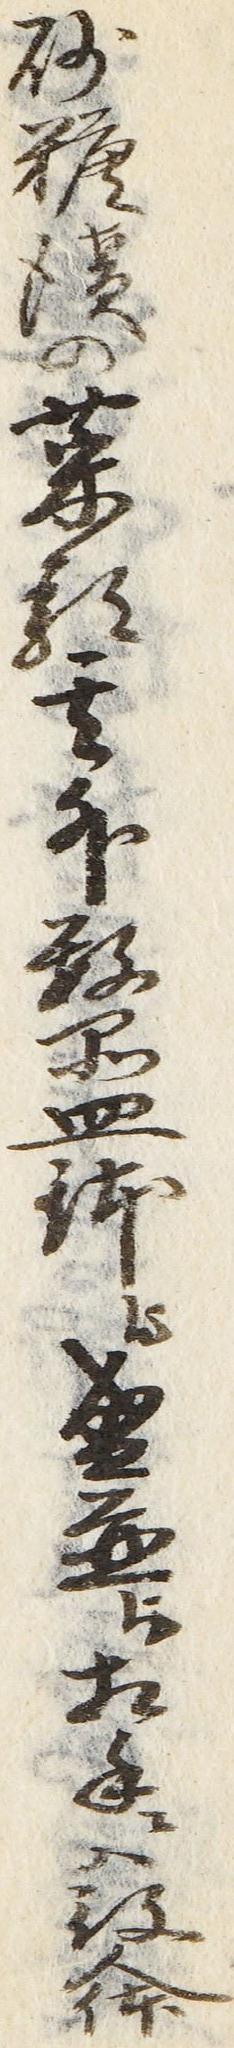砂糖漬の菜類其外数品皿躰江盛並江相手ニハ役人体
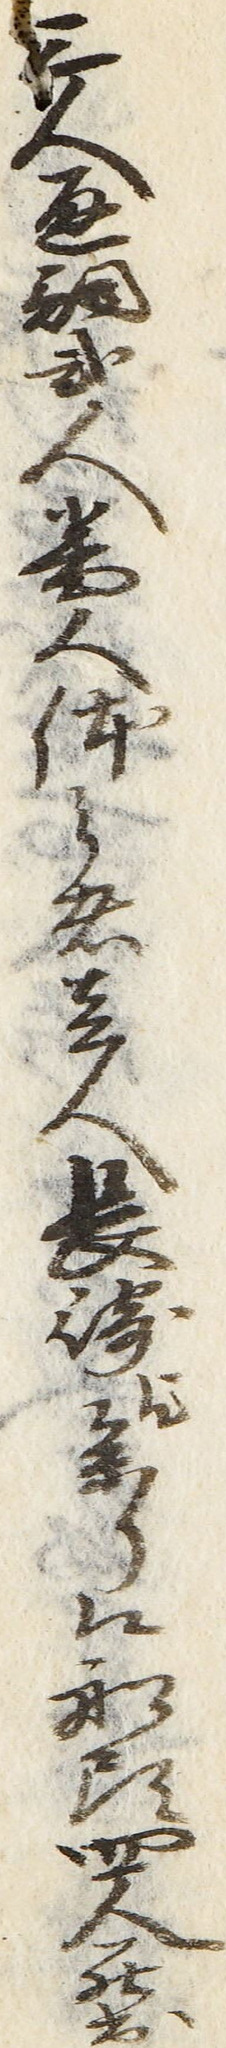三人通詞弐人番人体之者壱人長崎江参り候舩頭四人罷出
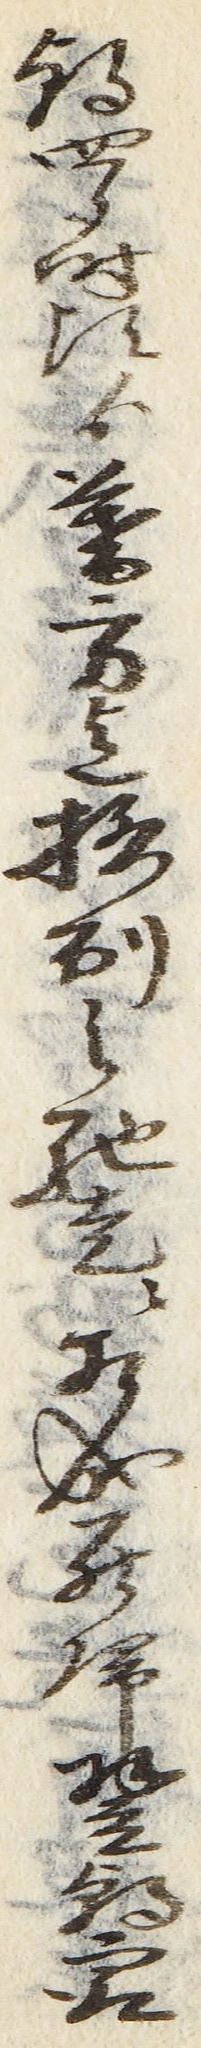朝四ツ時比ゟ暮方迄格別之馳走ニ相成罷帰翌朝最
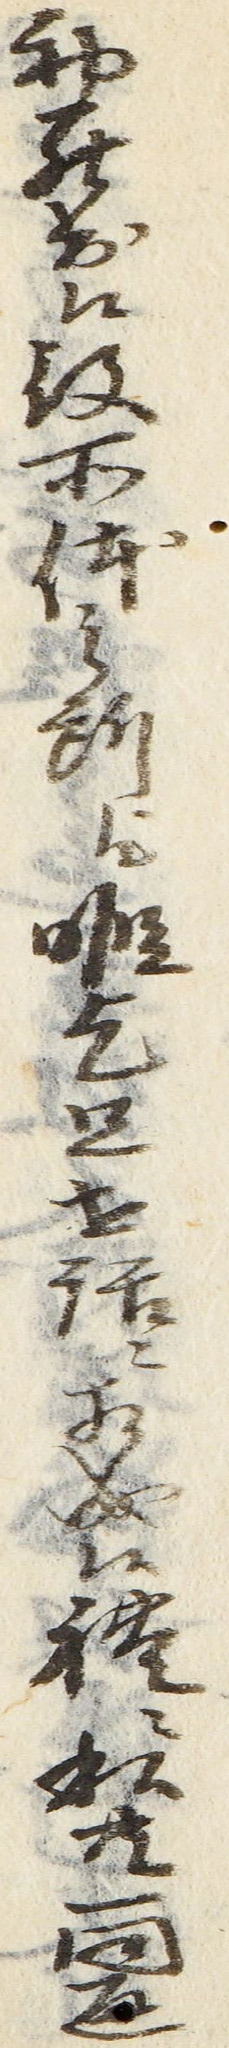初罷出候役所体之所江暇乞且世話ニ相成候禮ニ私共一同通

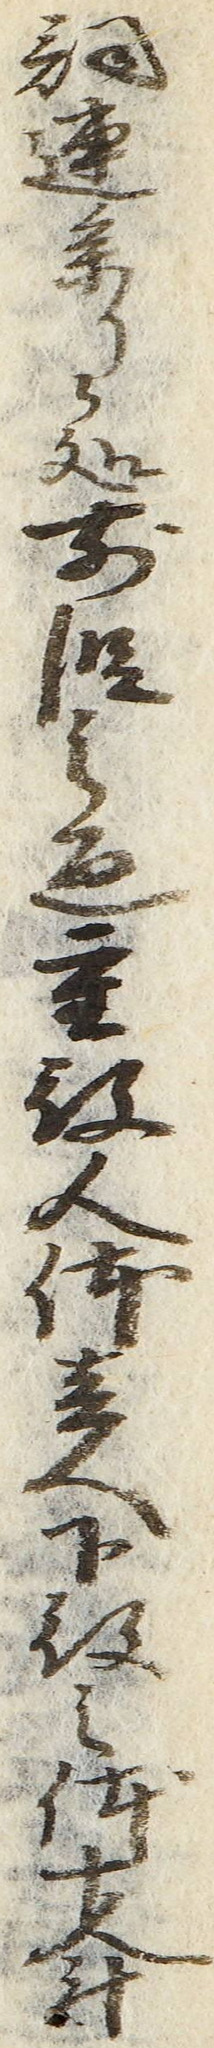詞連参り候処前段之通重役人体壱人下役之体十人斗
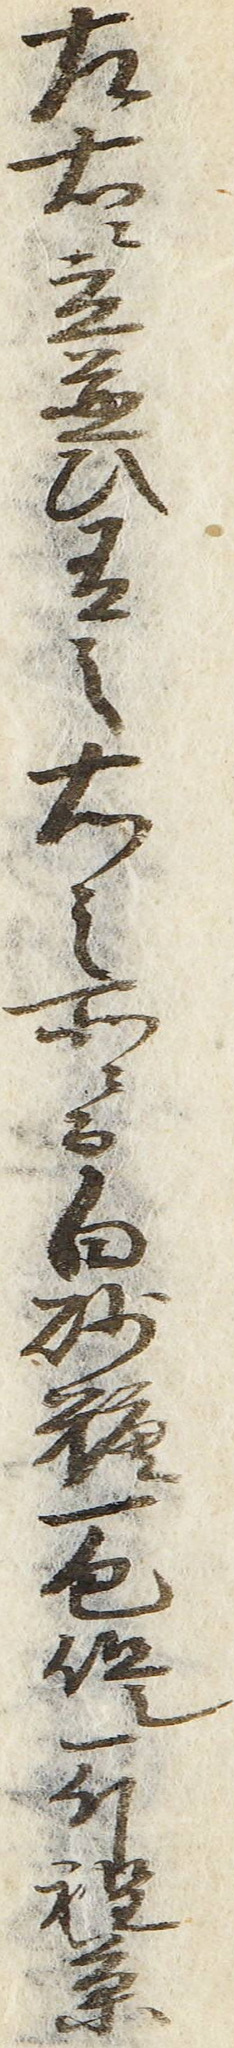左右ニ立並ひ有之右之所ニ而白砂糖一包但シ一斤程菓
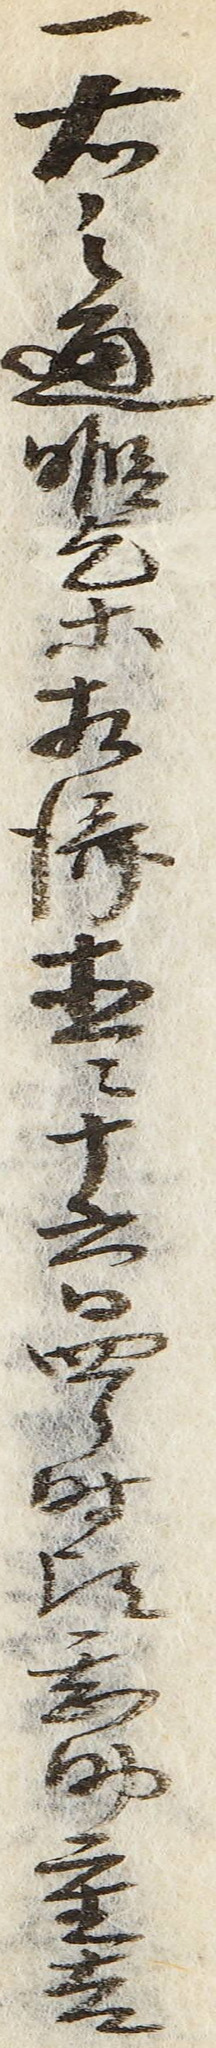一右之通暇乞等相濟直ニ十六日四ツ時比勘助重吉
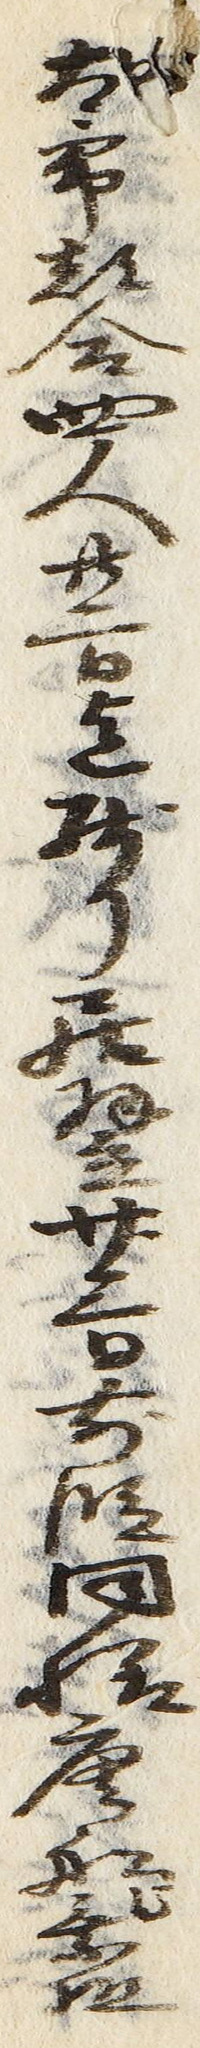太郎都合四人廿二日迄残り居翌廿三日前段同様唐舩江乗組
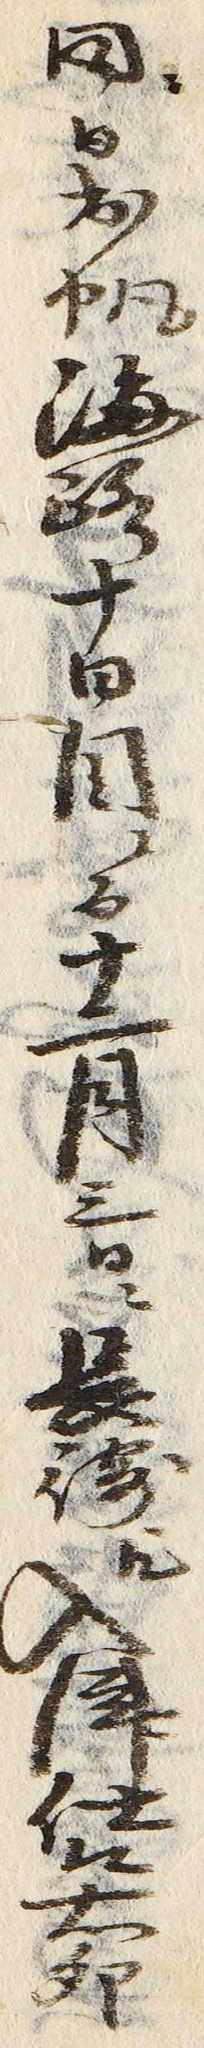同日出帆海路十日目ニ而十二月三日ニ長崎江入津仕候右卯
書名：漂流人善助聞書
